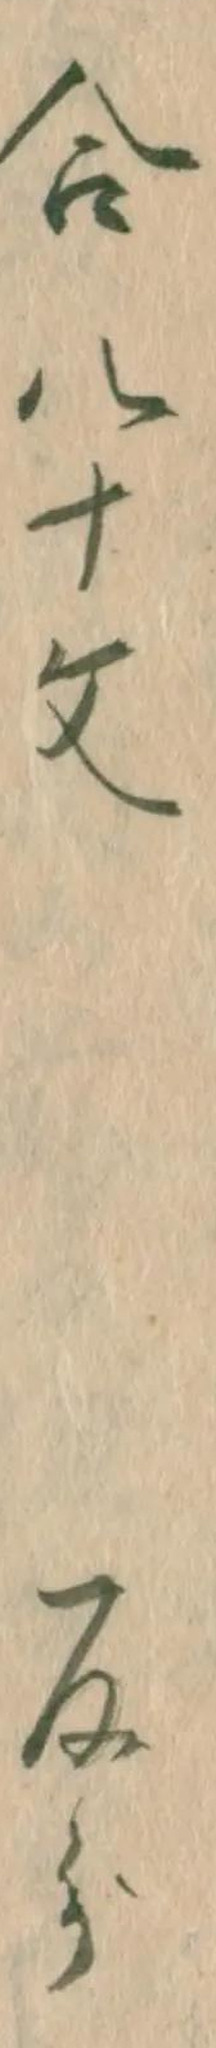合八十文反分
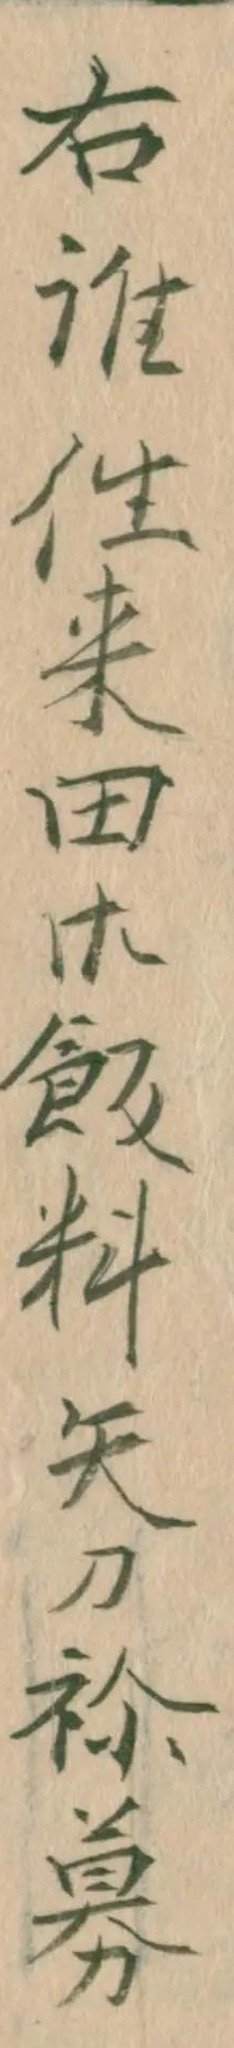右誰往来田御飯料矢刀祢募
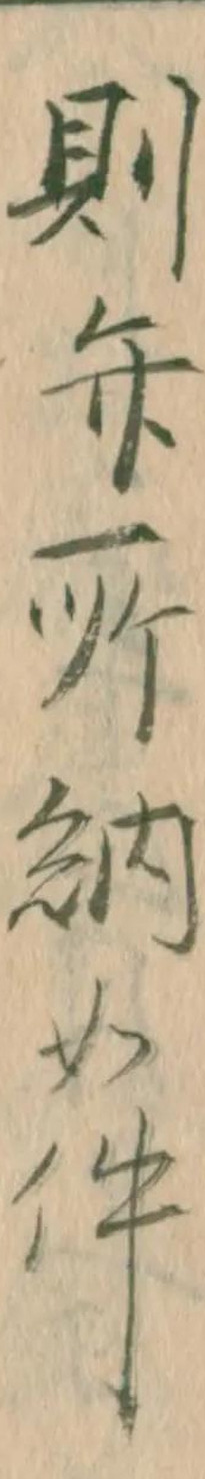則弁所納如件

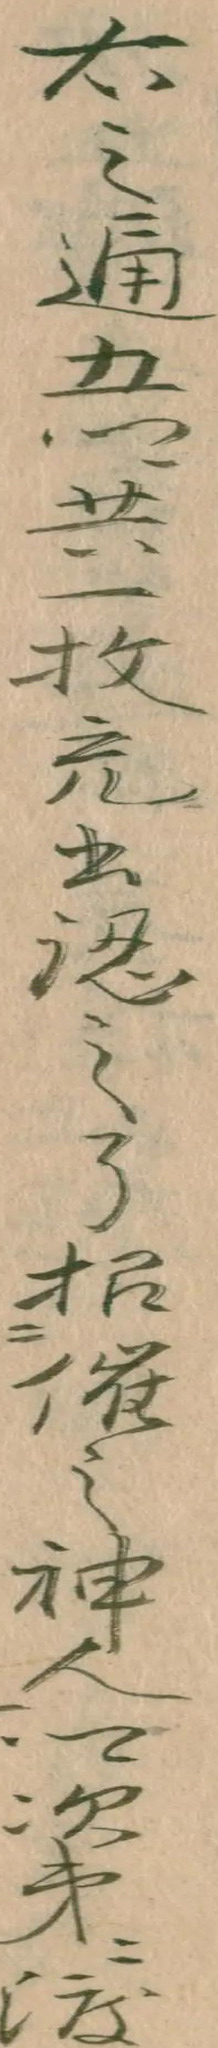右之通五郷共一枚充書認之了招催之神人郷次第ニ渡
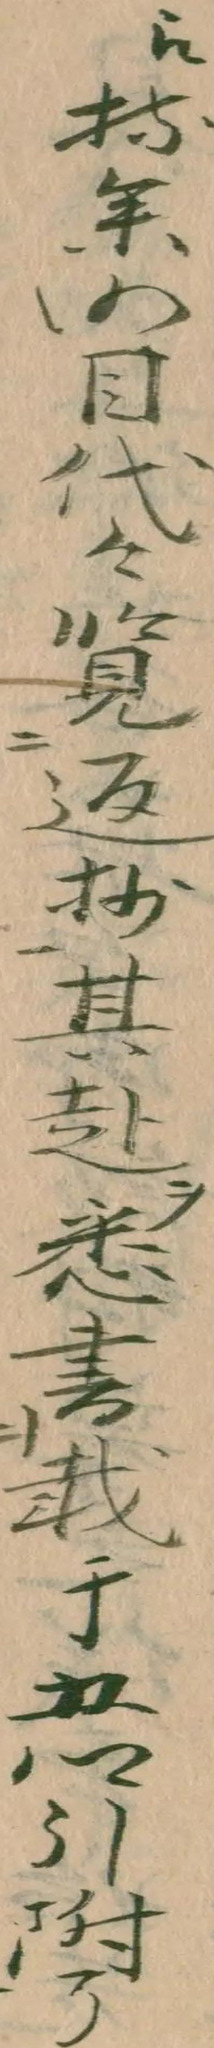え持参何目代々覧返抄其赴ヲ悉書-載于五郷引附了
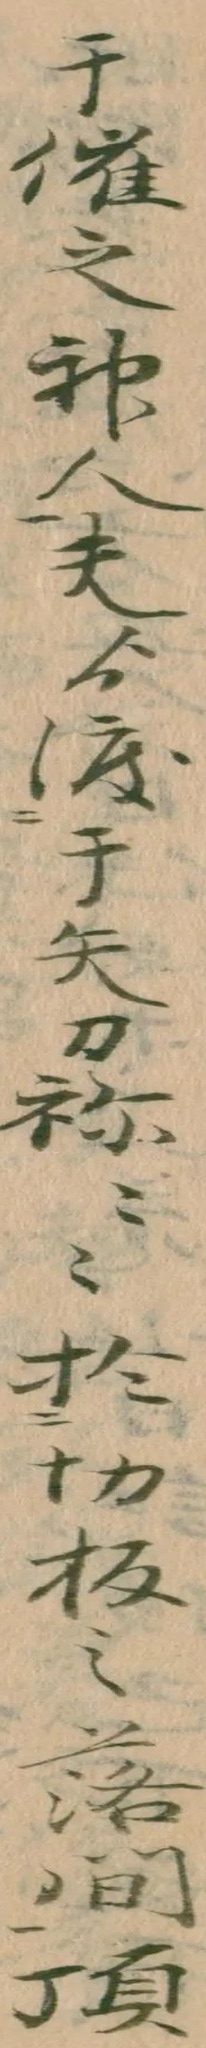于催之神人夫ゟ渡于矢刀祢々々於切板之落間頂
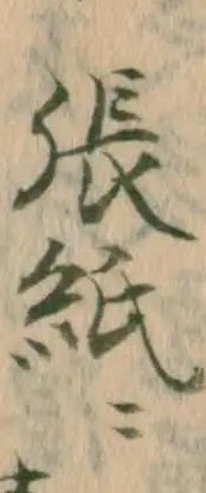張紙ニ
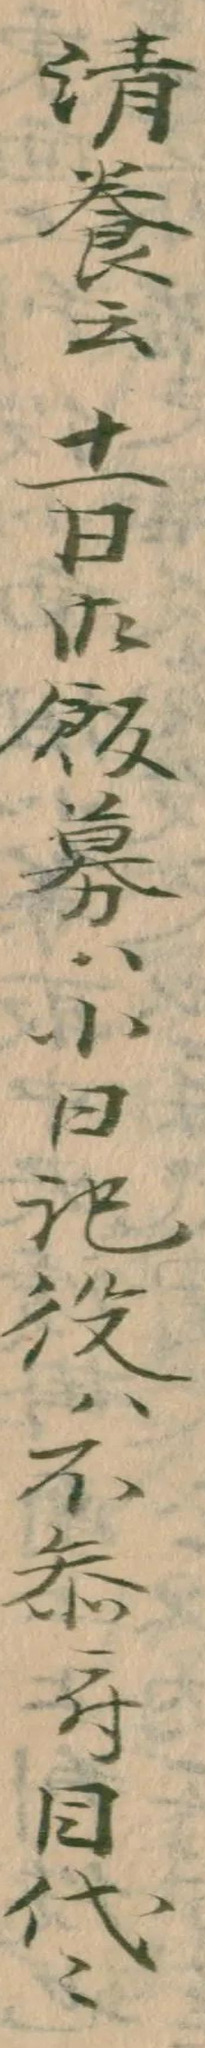請養云十一日御飯募ハ小日記役ハ不参ニ付目代々
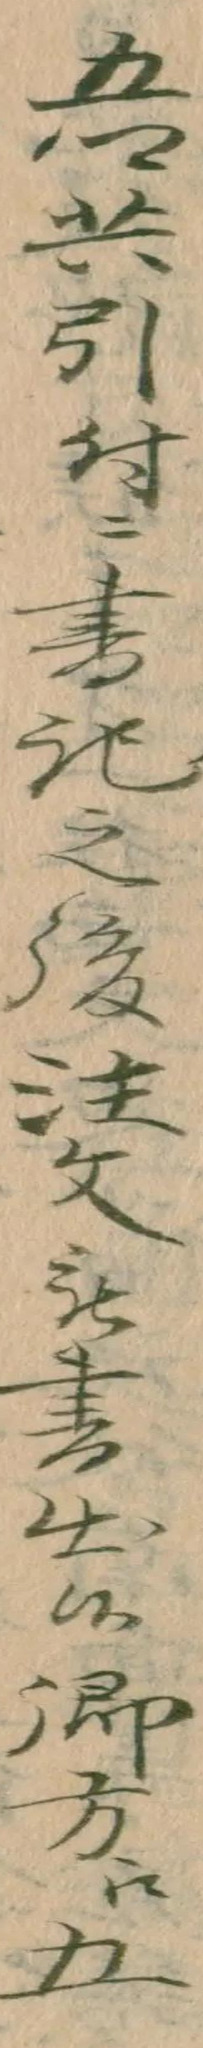五郷共引付ニ書記之後注文被書出候郷方え五
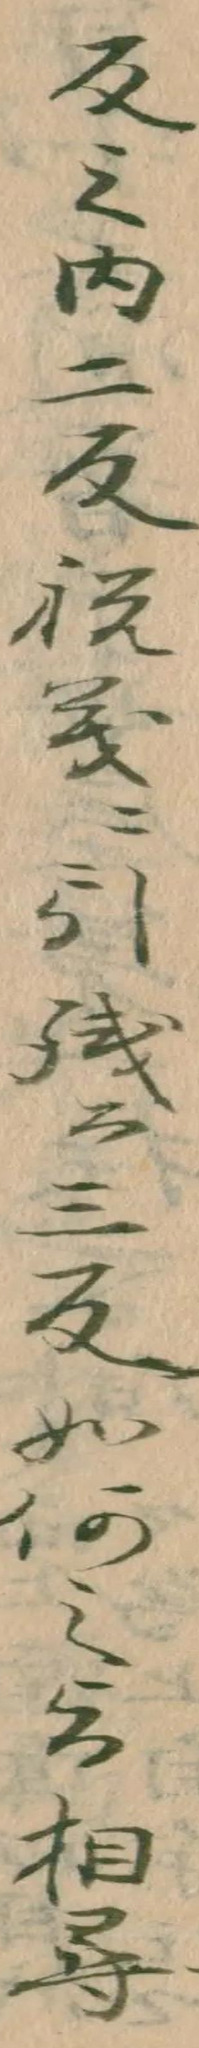反之内二反祝義ニ引残而三反如何之旨相尋
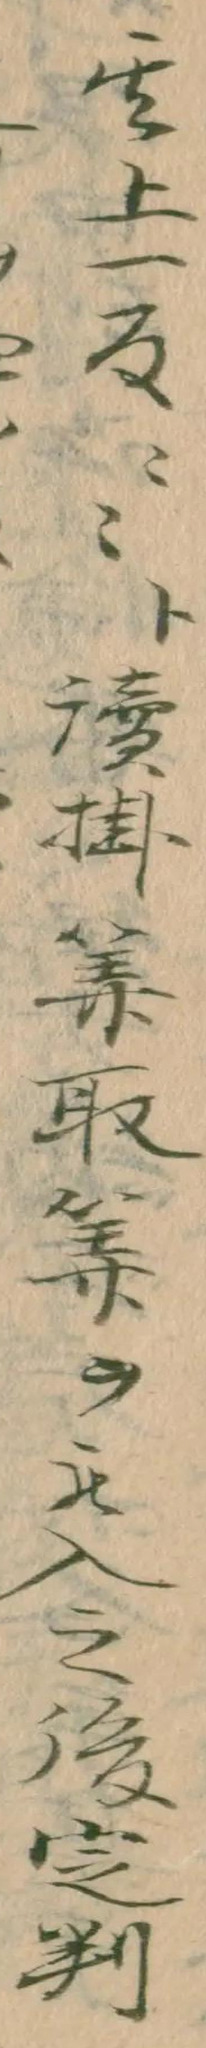其上一反々々ト読掛算取算ヲ被入之後定判
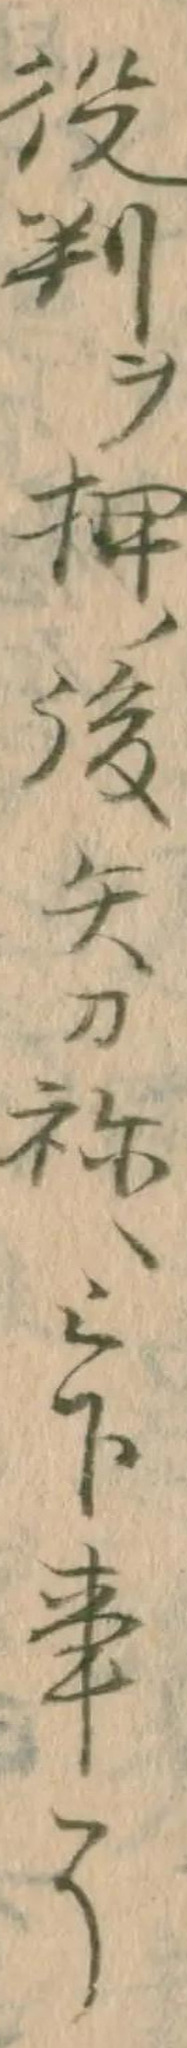役判ヲ押ノ後矢刀祢へ被下事了
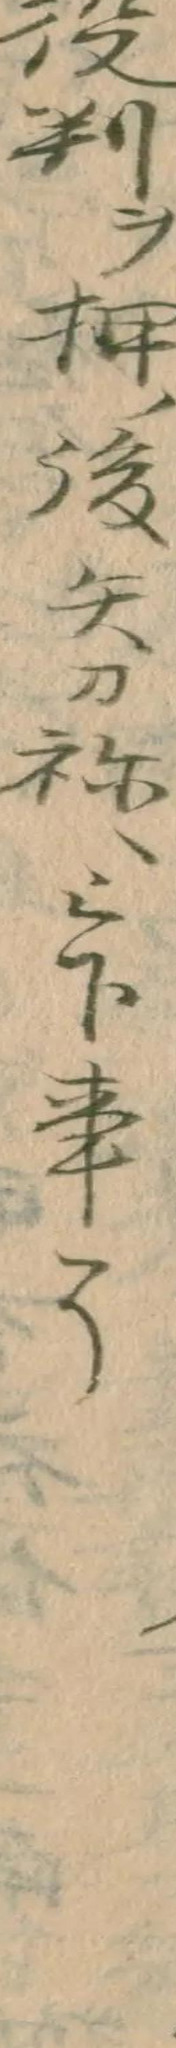役判ヲ押ノ後矢刀祢へ被下事了
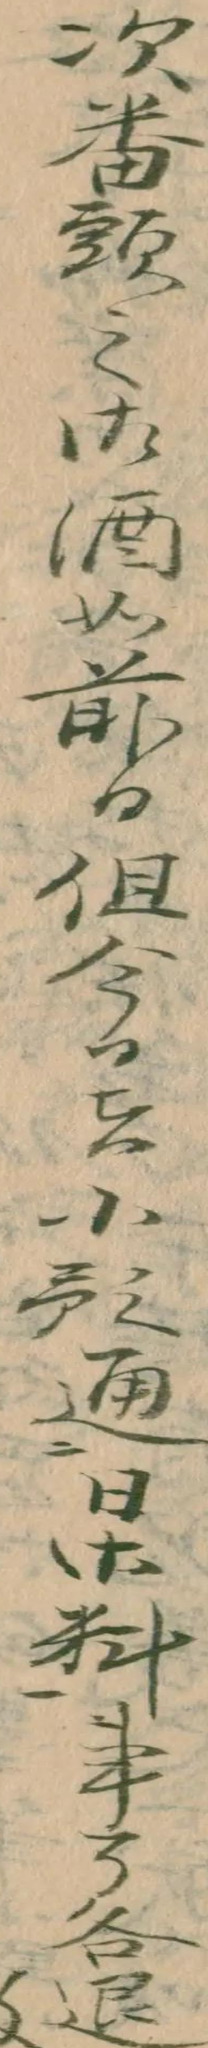次番頭之御酒如前日但今日者小預通日御料事了各退散
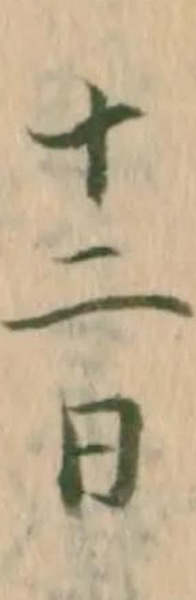十二日
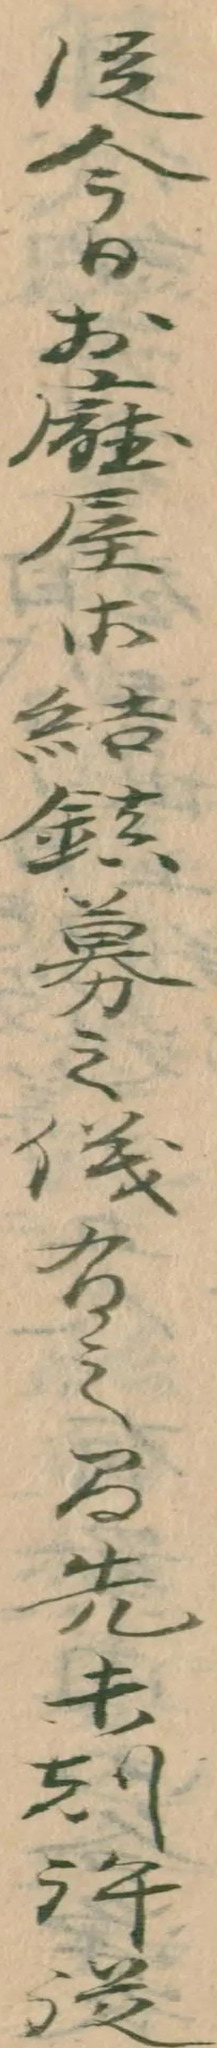一従今日於庁屋御結鎮募之儀有之間先未刻許従
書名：賀茂社記録. 第26冊
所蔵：国立国会図書館 National Diet Library, JAPAN
